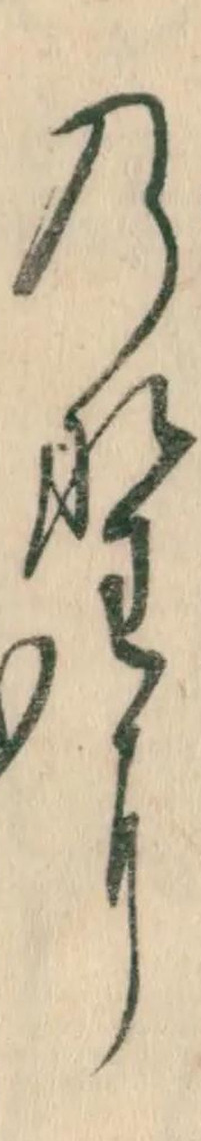の野に
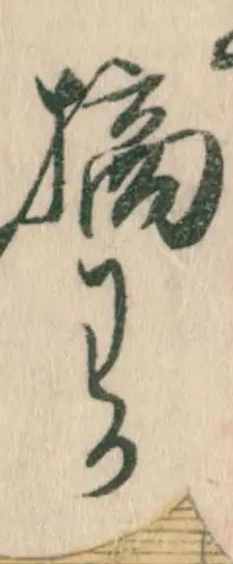摘わか
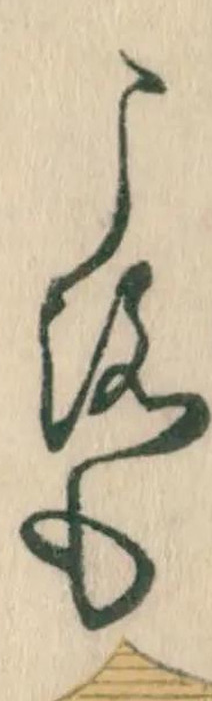ころも

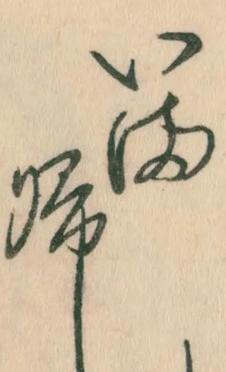いまし
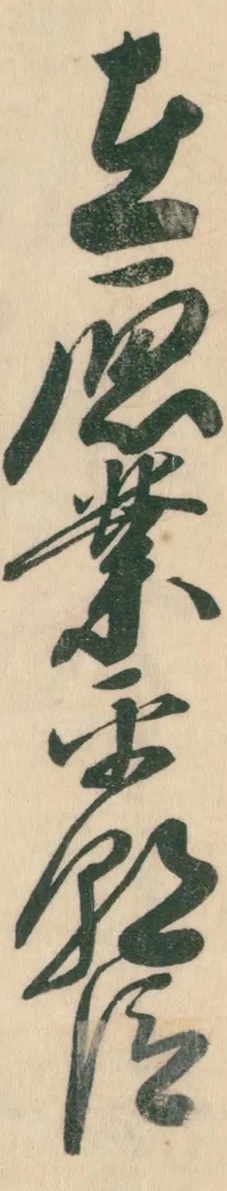在原業平朝臣
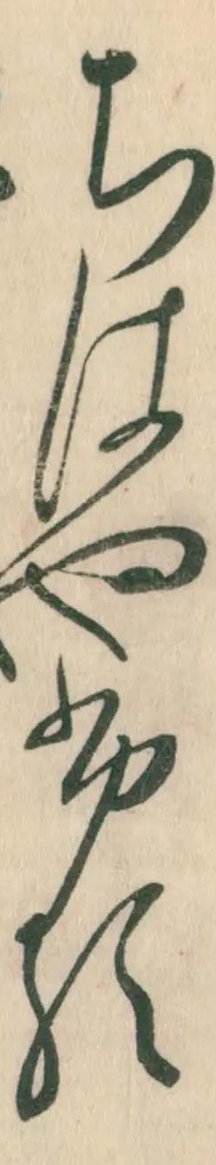ちはやふる
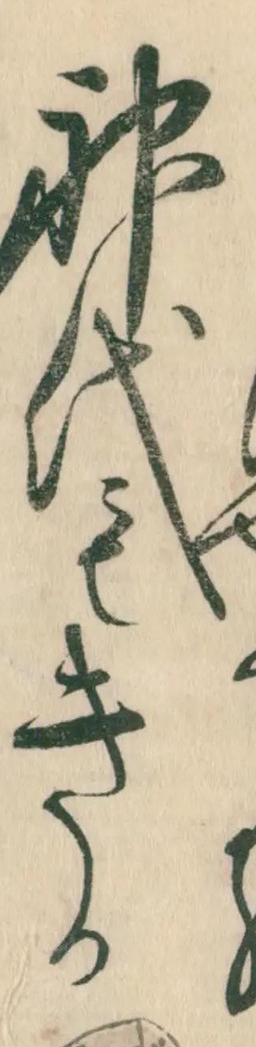神代もきか
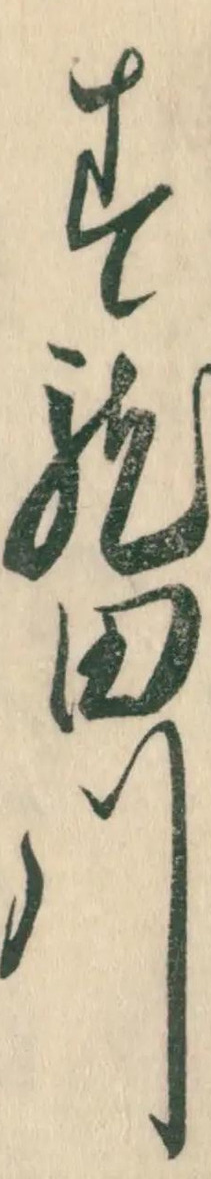す龍田川
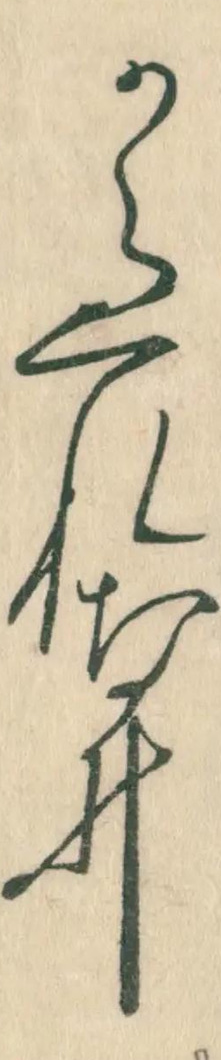からくれなゐ

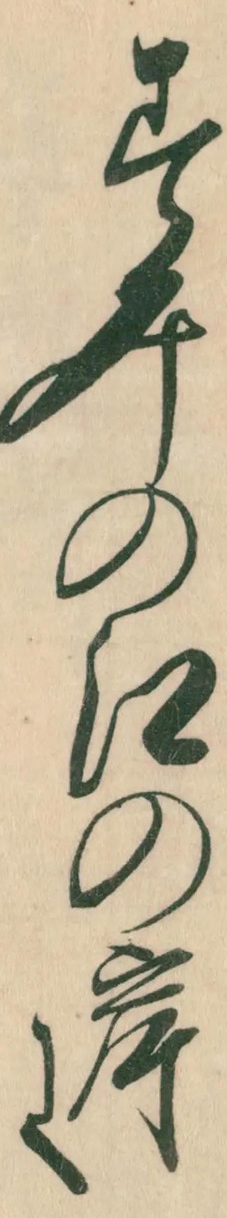すみの江の岸
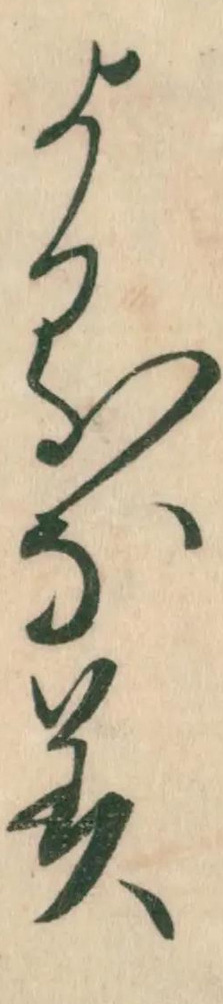よるなみ
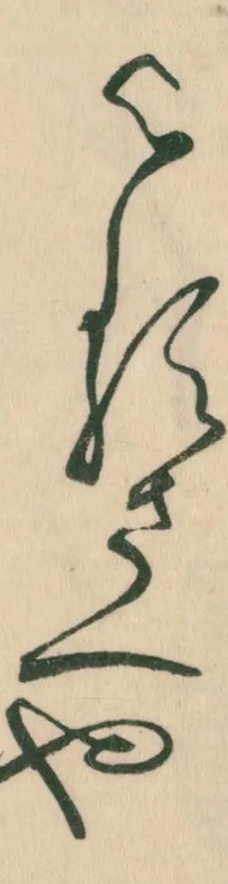よるさへや
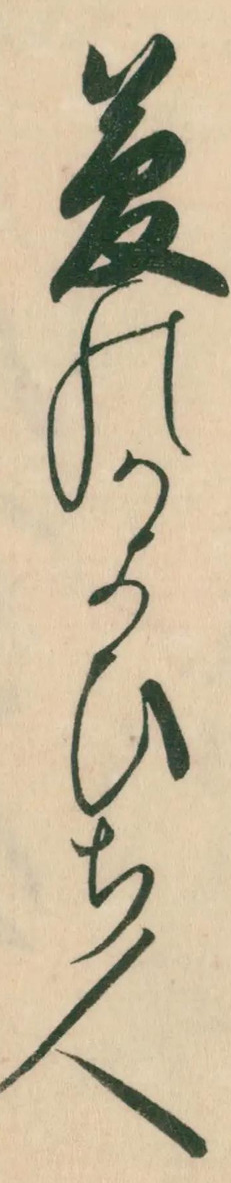夢のかよひち人
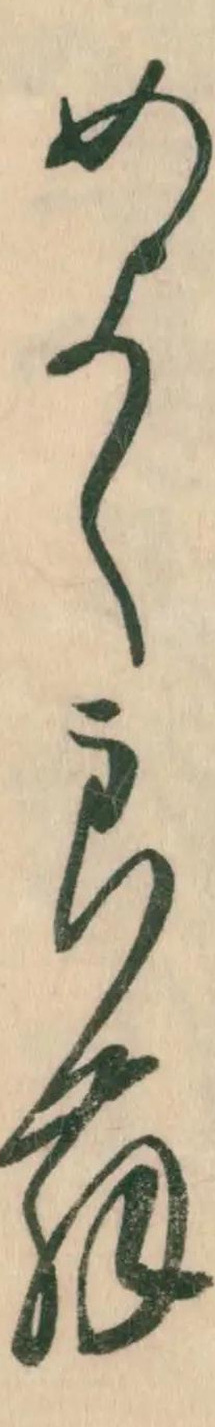めよくらむ
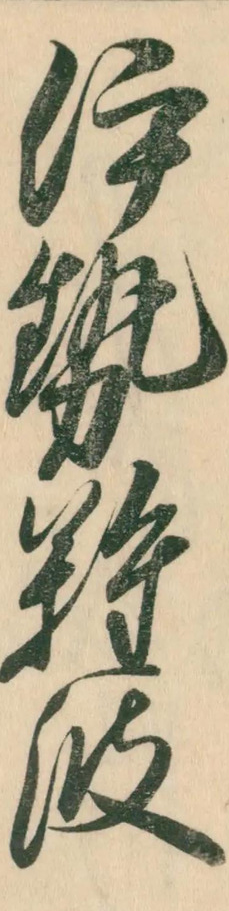伊勢難波
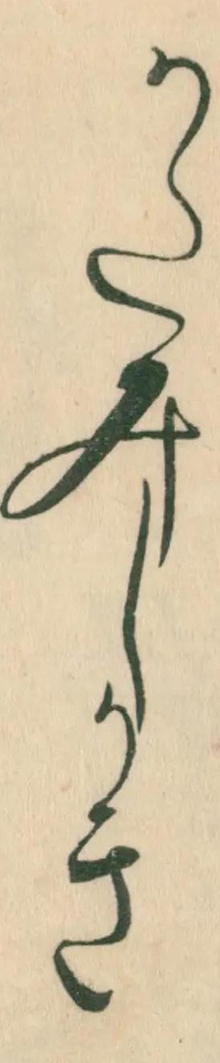かたみしかき
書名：錦百人一首あつま織
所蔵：国立国会図書館 National Diet Library, JAPAN
